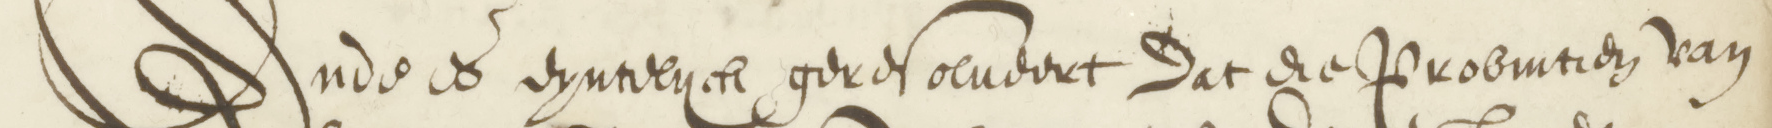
Ende is eyntelyck geresolueert dat de Provintien van
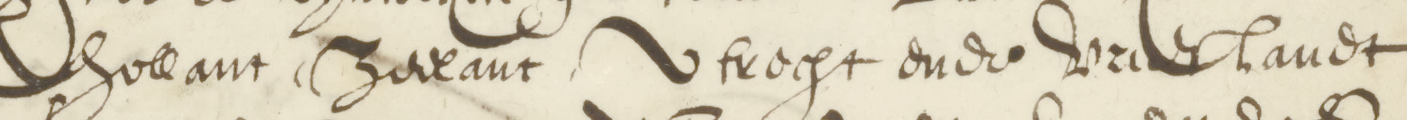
Hollant, Zeelant, Utrecht ende Vrieslandt
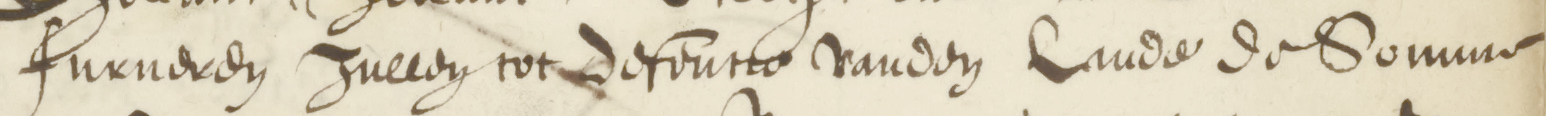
furneren zullen tot defentie vanden Lande de Somme
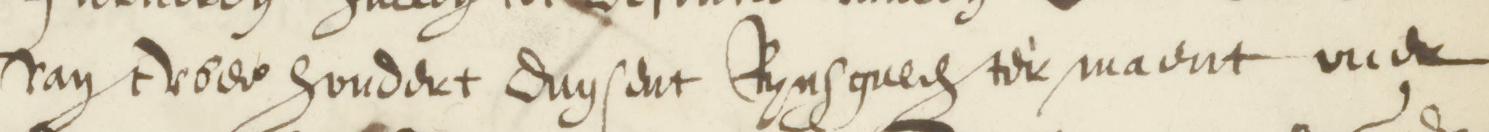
van twee hondert duysent Rynsguld ter maent vuer
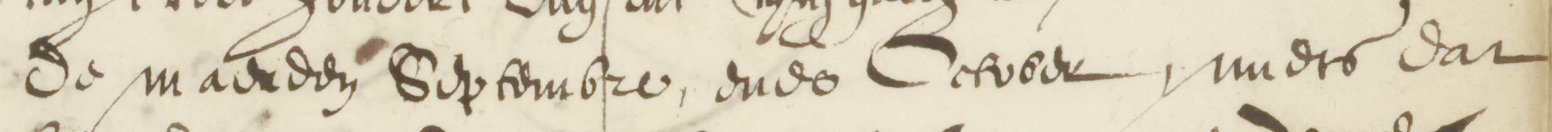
de maenden Septembre ende October, midts dat
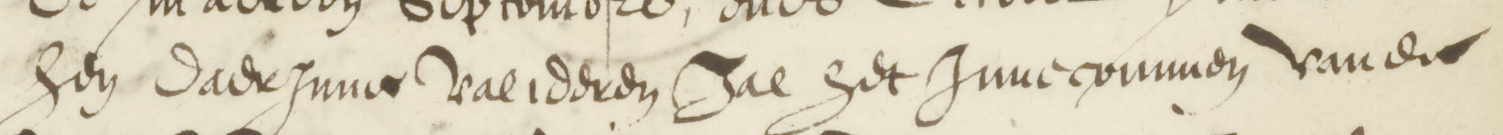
hen daerInne valideren zal het Innecommen vande
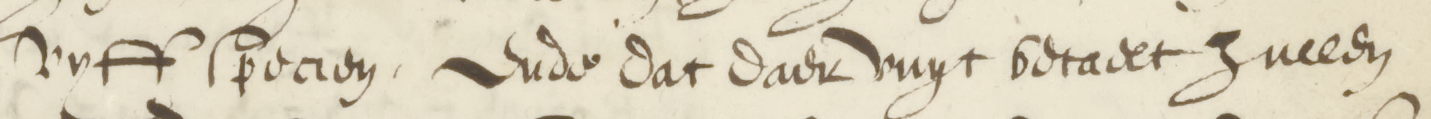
vyff specien, ende dat daer vuyt betaelt zullen
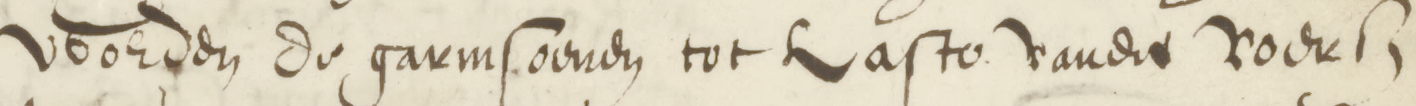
worden de garnisoenen tot Laste vande voers
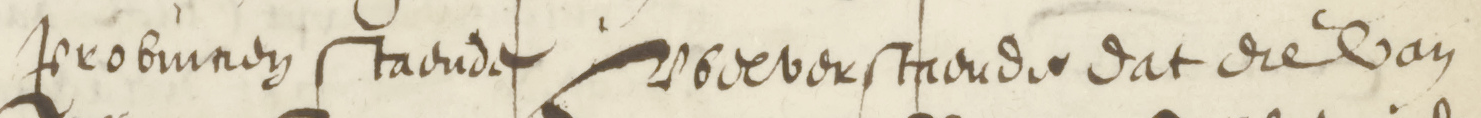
provintien staende welverstaende dat die van
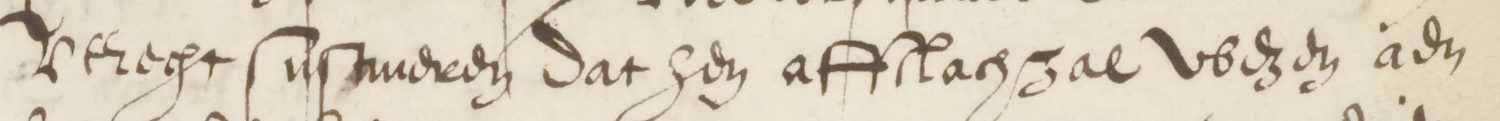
Utrecht sustineren dat hen affslach zal werden aen
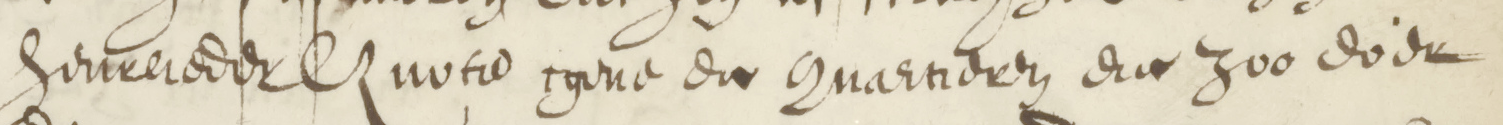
heurlieder Quote tgene de quartieren die zoo doer
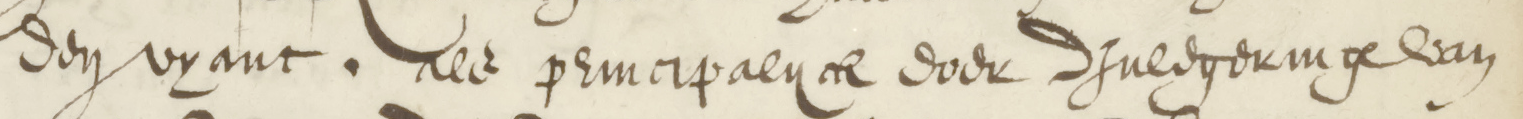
den vyant als principalyck doer dInlegeringe van
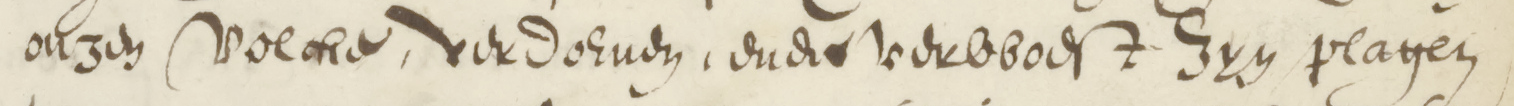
onzen volcke, verdoruen, ende verwoest zijn plagen
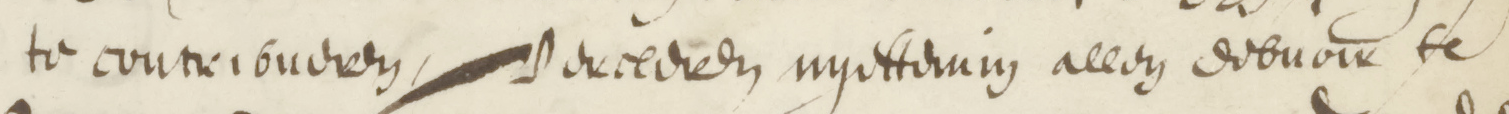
te contribueren, vercleren nyettemin allen debuoir te
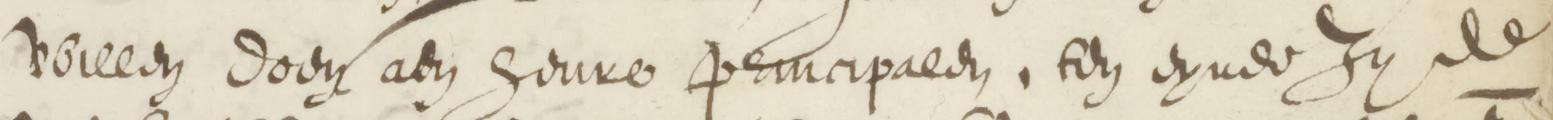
willen doen aen heure principalen, ten eyde zy de
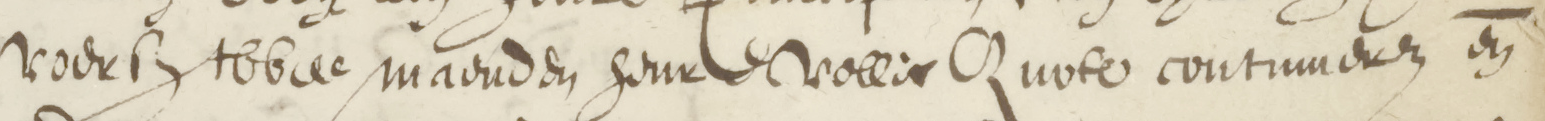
voers twee maende heur volle Quote continueren en
